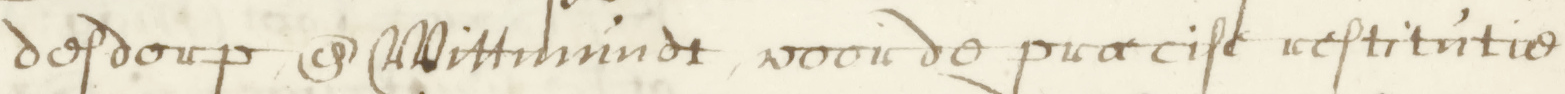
desdorp & Wittmundt, voor de pracise restitutie
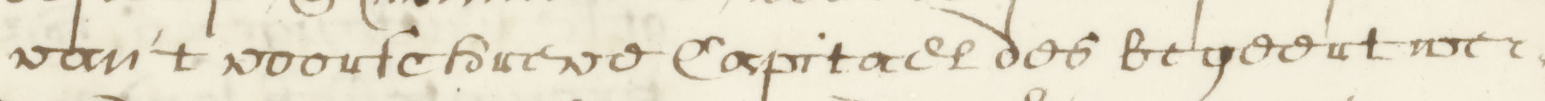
van 't voorschreve Capitael des begeert wer„
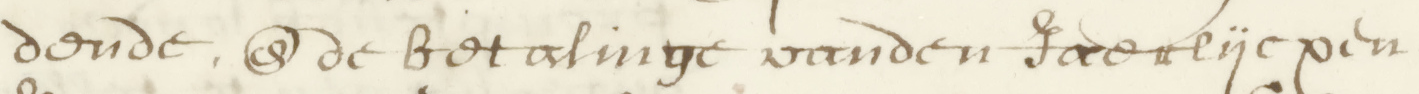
dende, & de betalinge vanden Jaerlijcxen
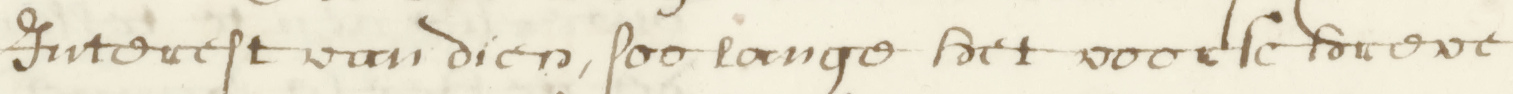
Interest van dien, soo lange het voorschreve
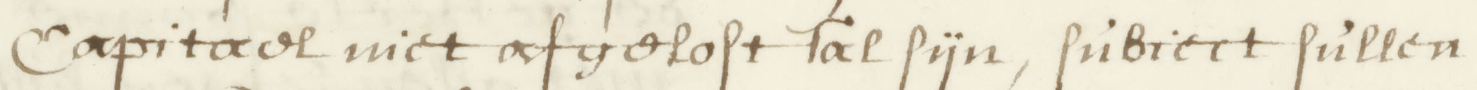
Capitael niet afgelost sal sijn, subiect sullen
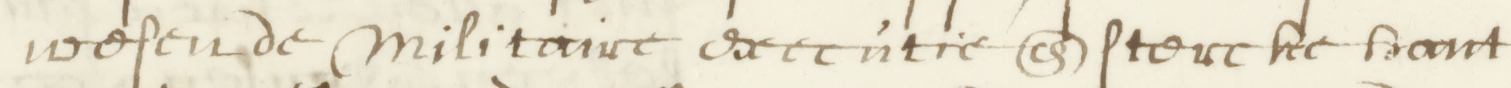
wesen de militaire executie & stercke hant
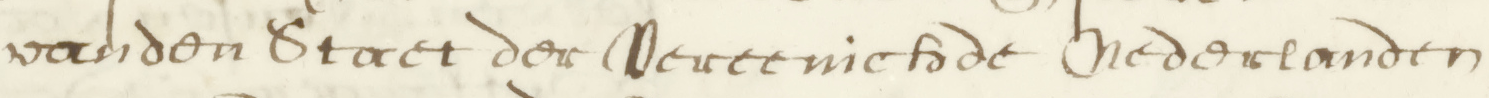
van den Staet der Vereenichde Nederlanden
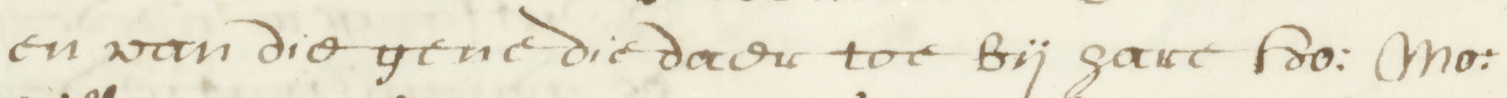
en van die gene die daer toe bij hare Ho:Mo:
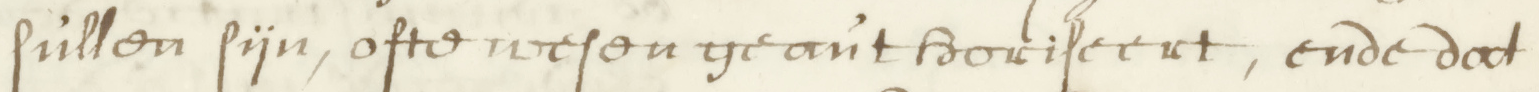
sullen sijn, ofte wesen geauthoriseert, ende dat
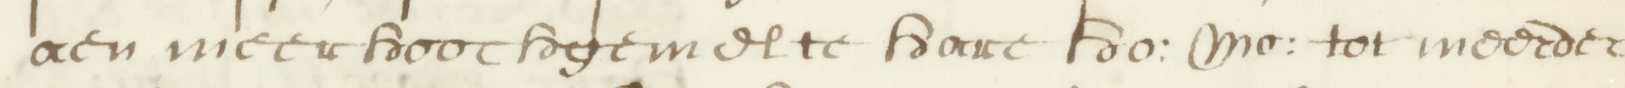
aen meerhoochgemelte hare Ho:Mo: tot meerder
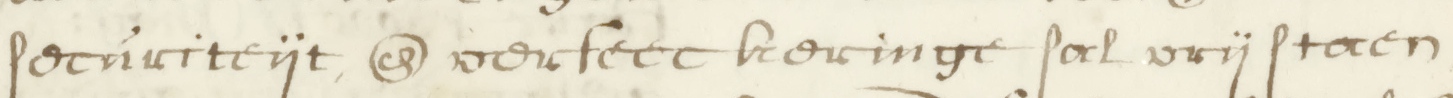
securiteijt, & verseeckeringe sal vrijstaen
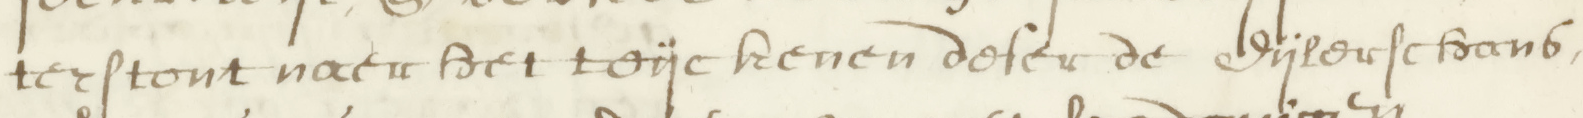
terstont naer het teijckenen deser de Dijlerschans
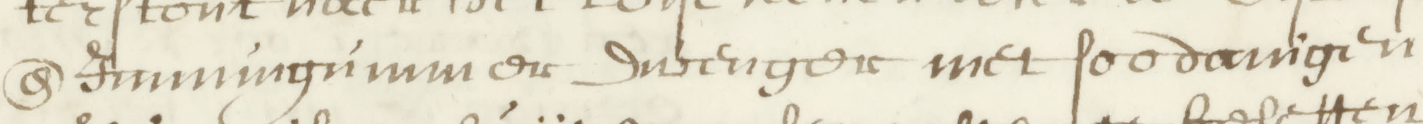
& Immuigummer Dwenger met soodanigen
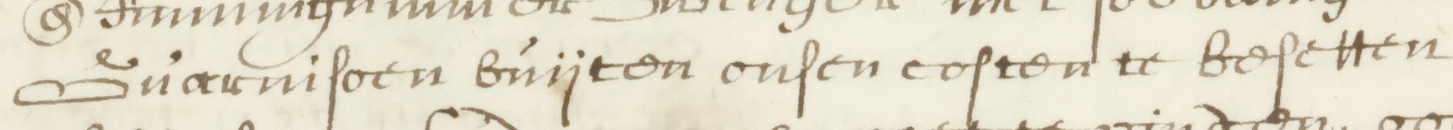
Guarnisoen buijten onsen costen te besetten,
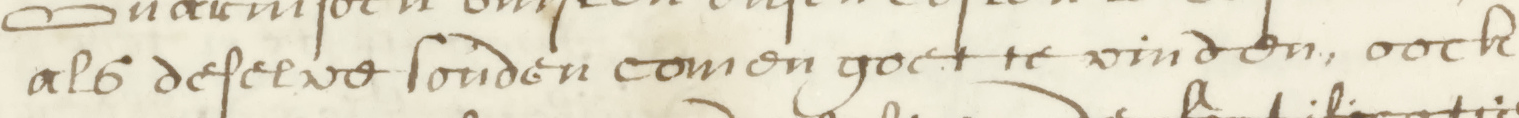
als deselve souden comen goet te vinden, oock
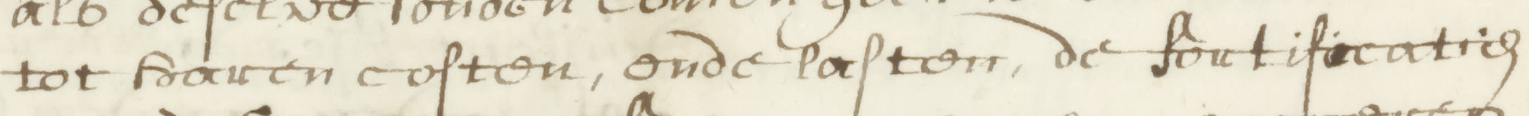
tot haren costen, ende lasten, de fortifacatien
